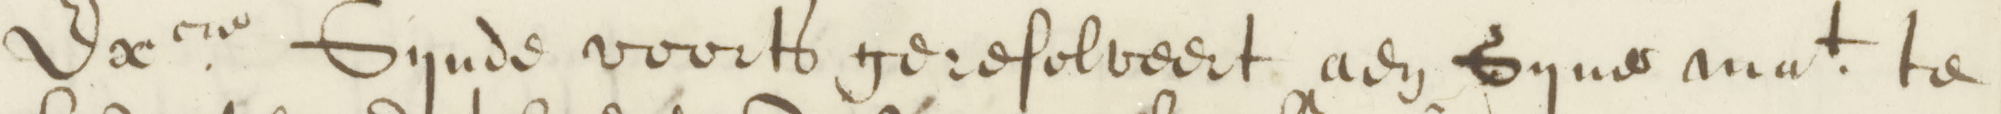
Excie. Synde voorts geresolveert aen Syne mat. te
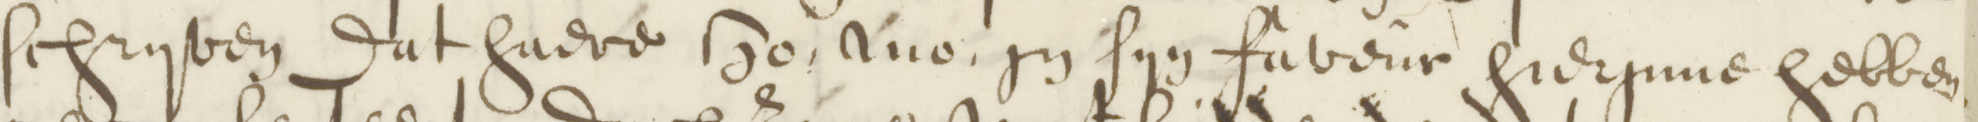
schryven dat haere Ho:Mo: in syn faveur hierinne hebben
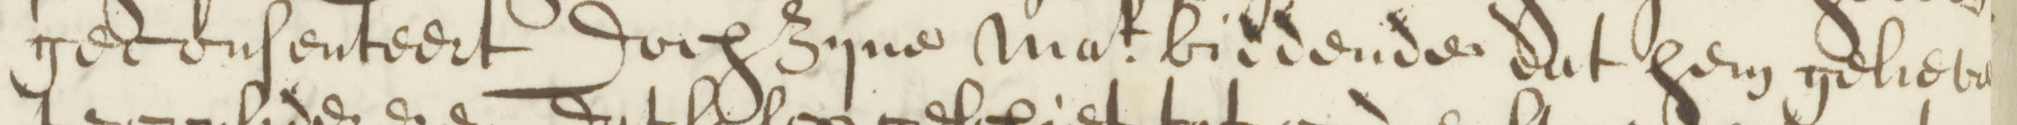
geconsenteert doch Zyne Mat. biddende dat hem gelieven
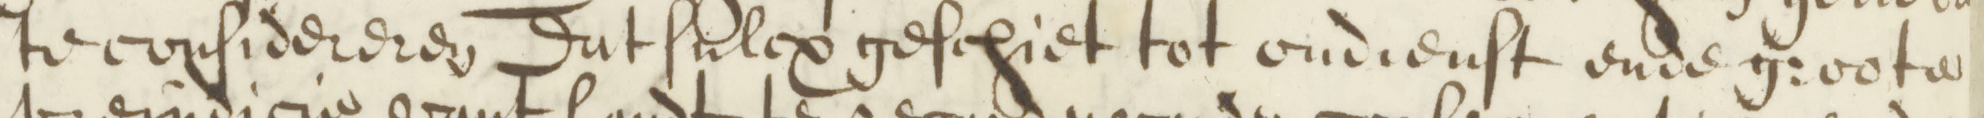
te considereren dat sulcx geschiet tot ondienst ende groote
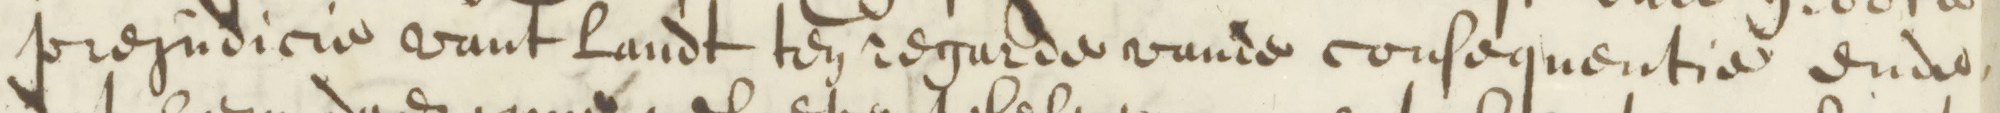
prejudicie vant landt ten regarde vande consequentie ende
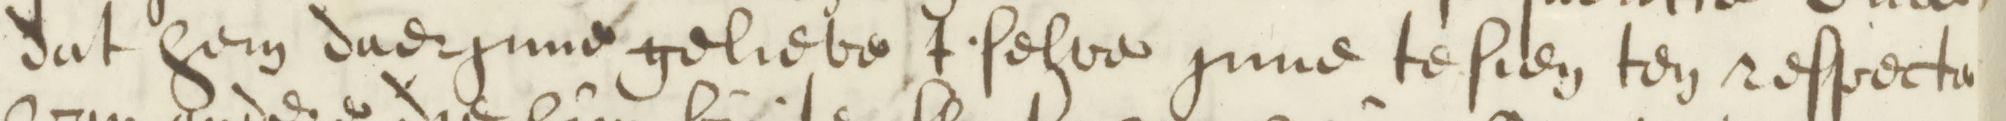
dat hem daerinne gelieve t' selve inne te sien ten respecte
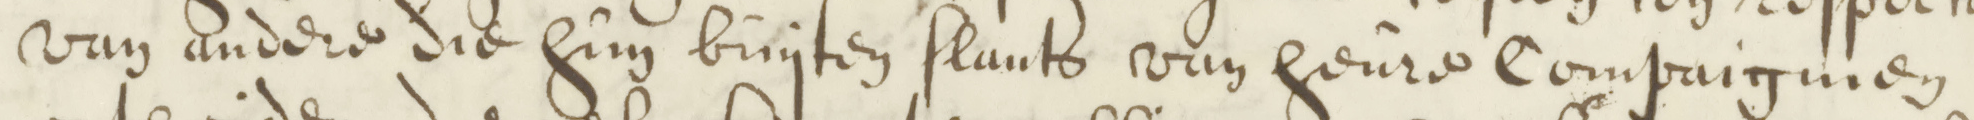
van andere die hun buijten slants van heure Compaignien
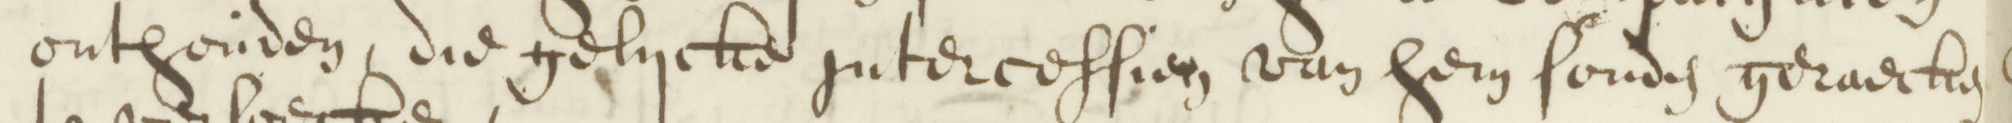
onthouden, die gelycke intercessien van hem souden geraecken
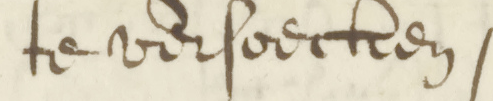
te versoecken.
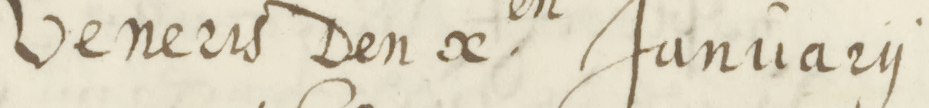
Veneris den xen. Januarij
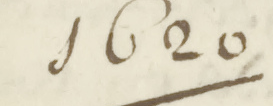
1620
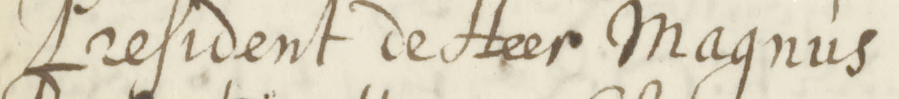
President de Heer Magnus
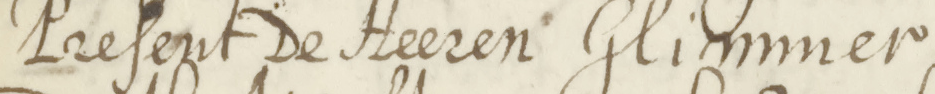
Present de Heeren Glimmer
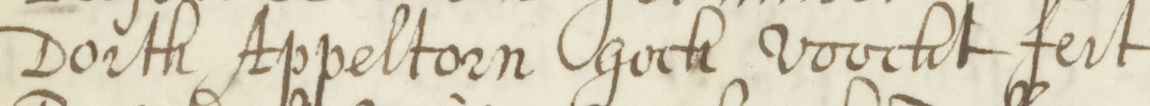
Dorth Appeltorn goch voocht Feit
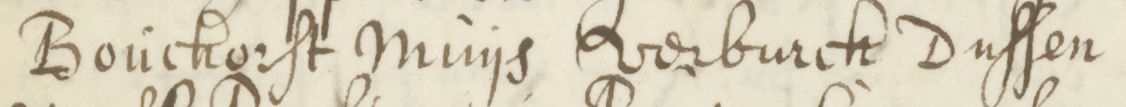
Bouchorst Muijs verburch Dussen
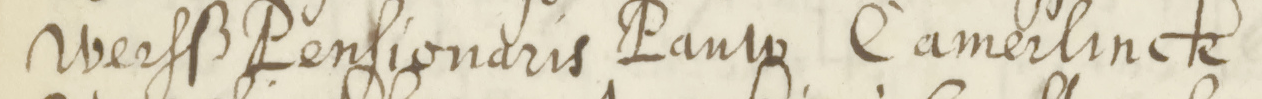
Werss Pensionaris Pauw Camerlinck
